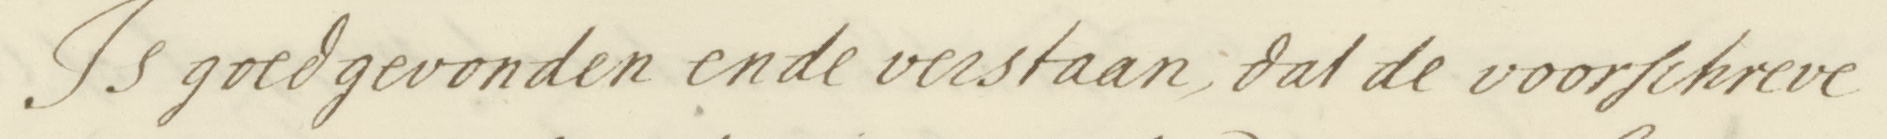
Is goedgevonden ende verstaan, dat de voorschreve
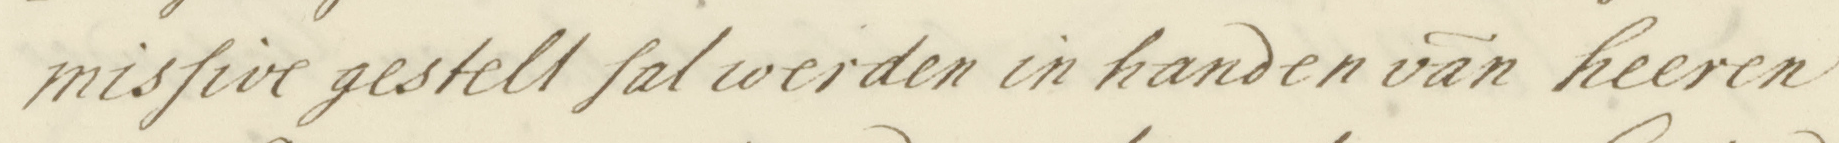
missive gestelt sal werden in handen van heeren
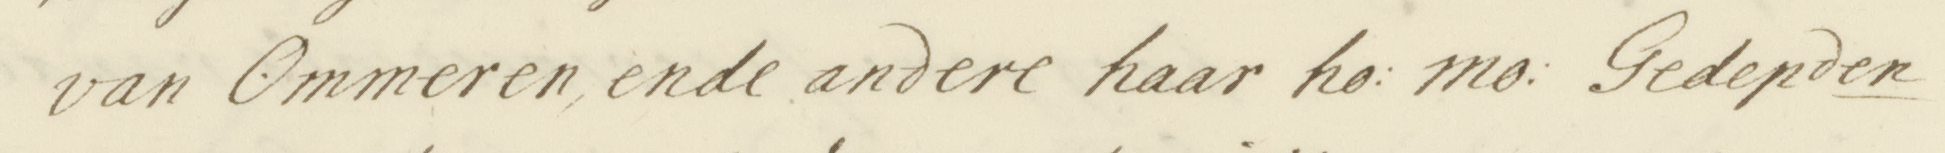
van Ommeren, ende andere haar ho:mo: Gedepden
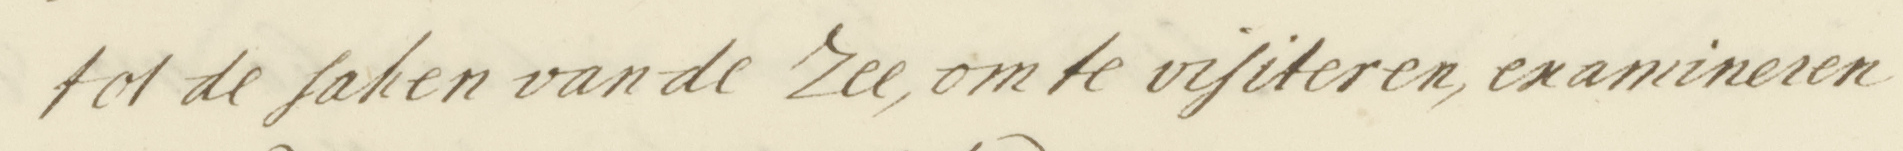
tot de saken van de Zee, om te visiteren, examineren
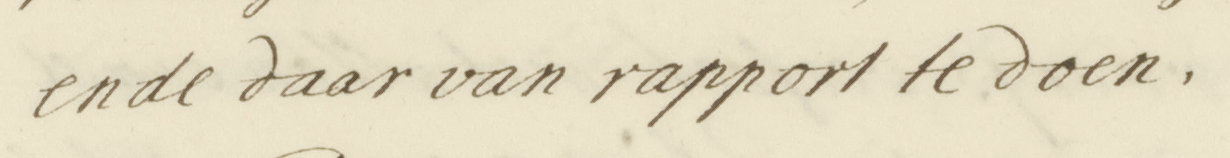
ende daar van rapport te doen.
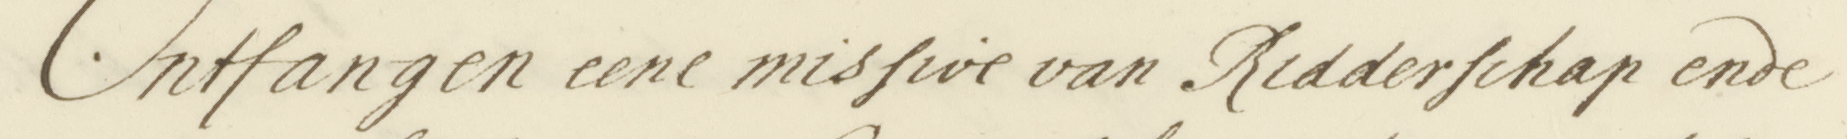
Ontfangen eene missive van Ridderschap ende
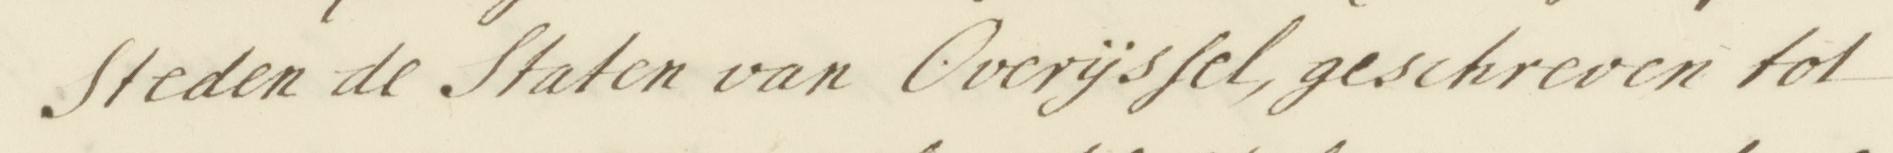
Steden de Staten van Overijssel, geschreven tot
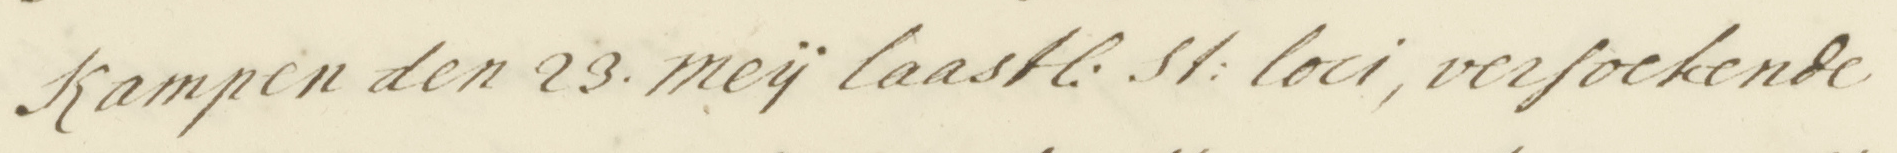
Kampen den 23. meij laastl: st: loci, versoekende
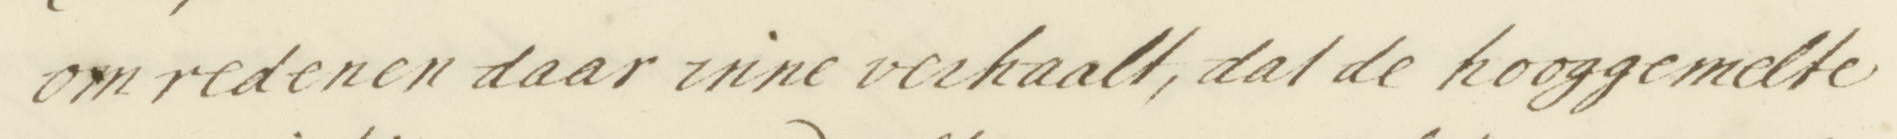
om redenen daar inne verhaalt, dat de hooggemelte
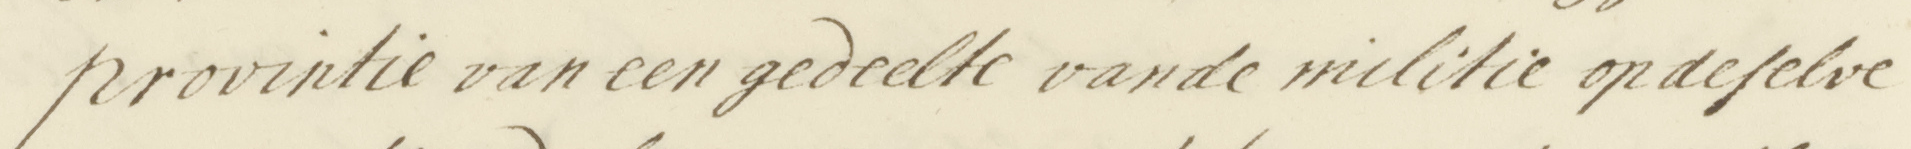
provintie van een gedeelte vande militie op deselve
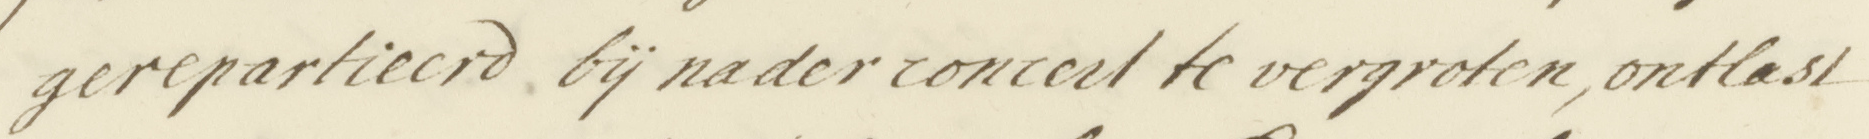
gerepartieerd bij nader concert te vergroten, ontlast
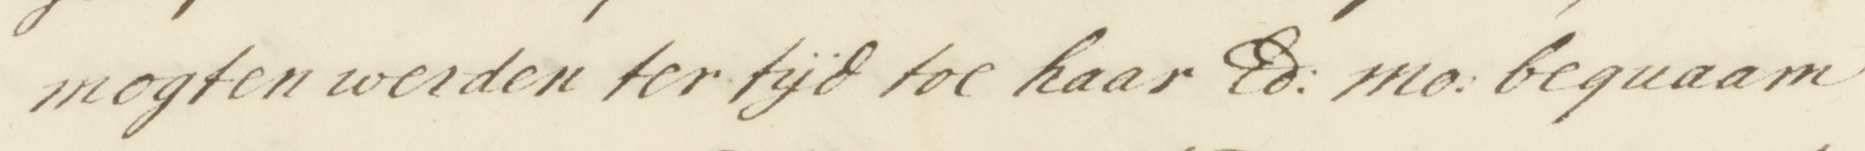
mogten werden ter tijd toe haar Ed:mo: bequaam
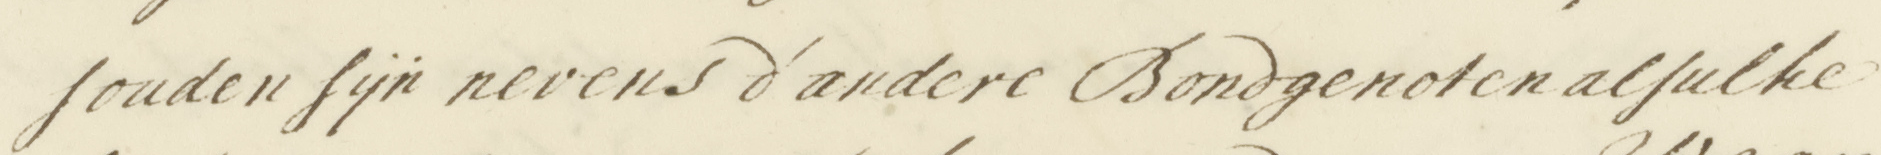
souden sijn nevens d’ andere Bondgenoten alsulke
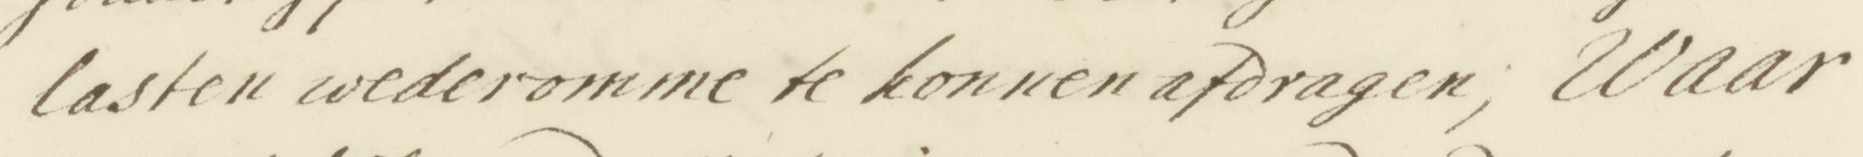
lasten wederomme te konnen afdragen; Waar
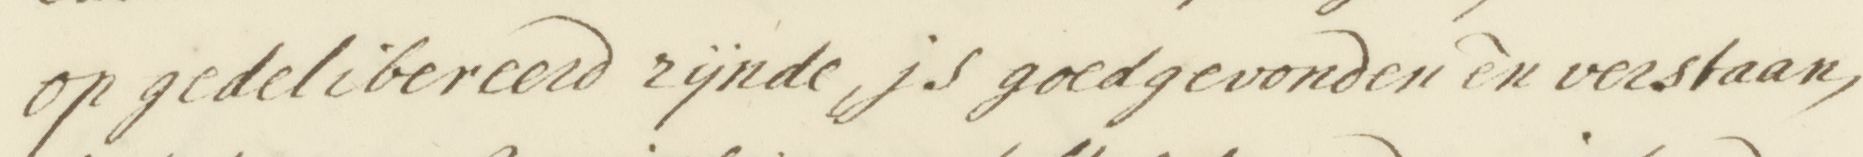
op gedelibereerd zijnde, is goedgevonden en verstaan,
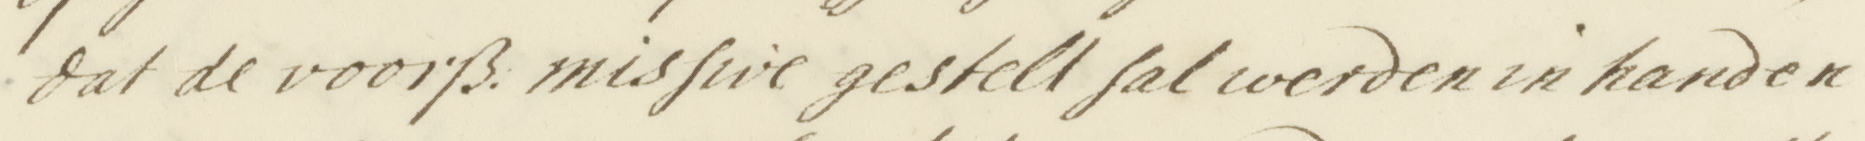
dat de voors: missive gestelt sal werden in handen
